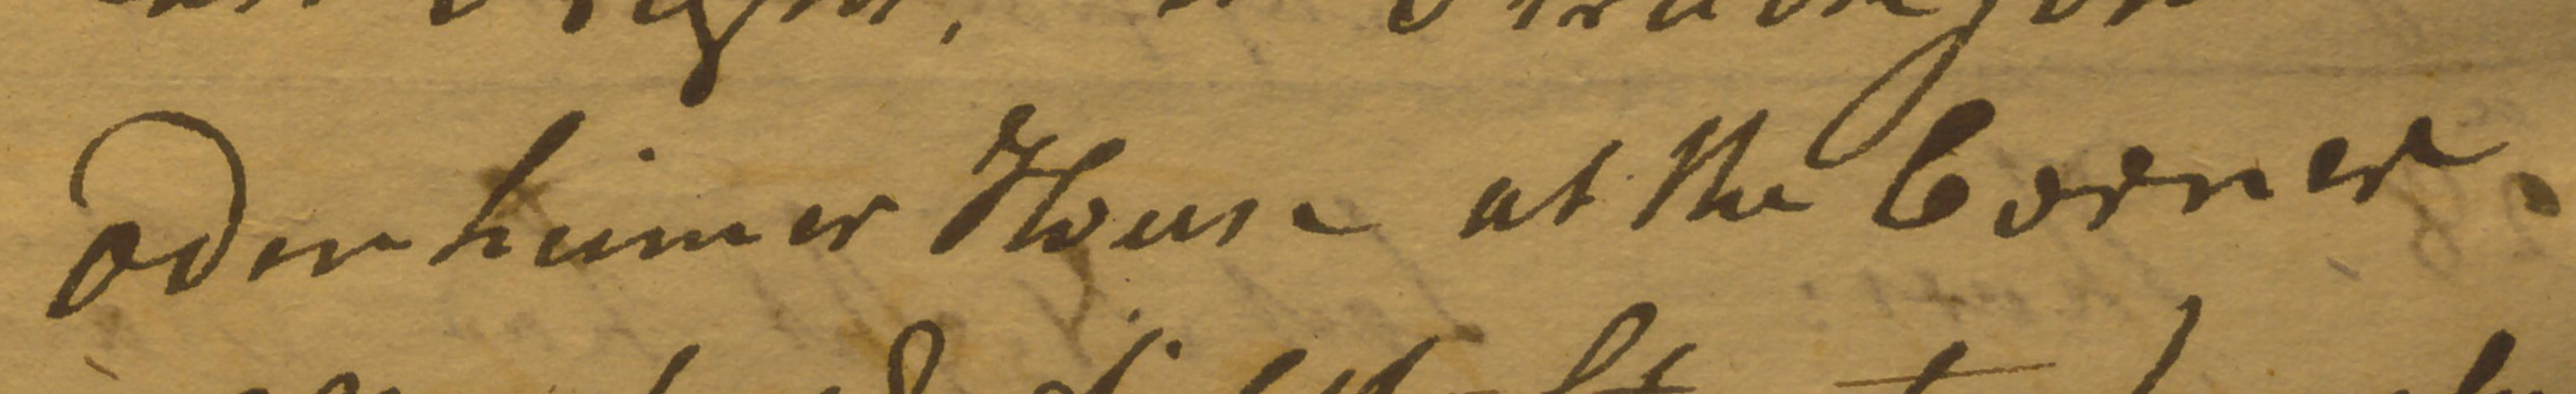odenheimer House at the Corner
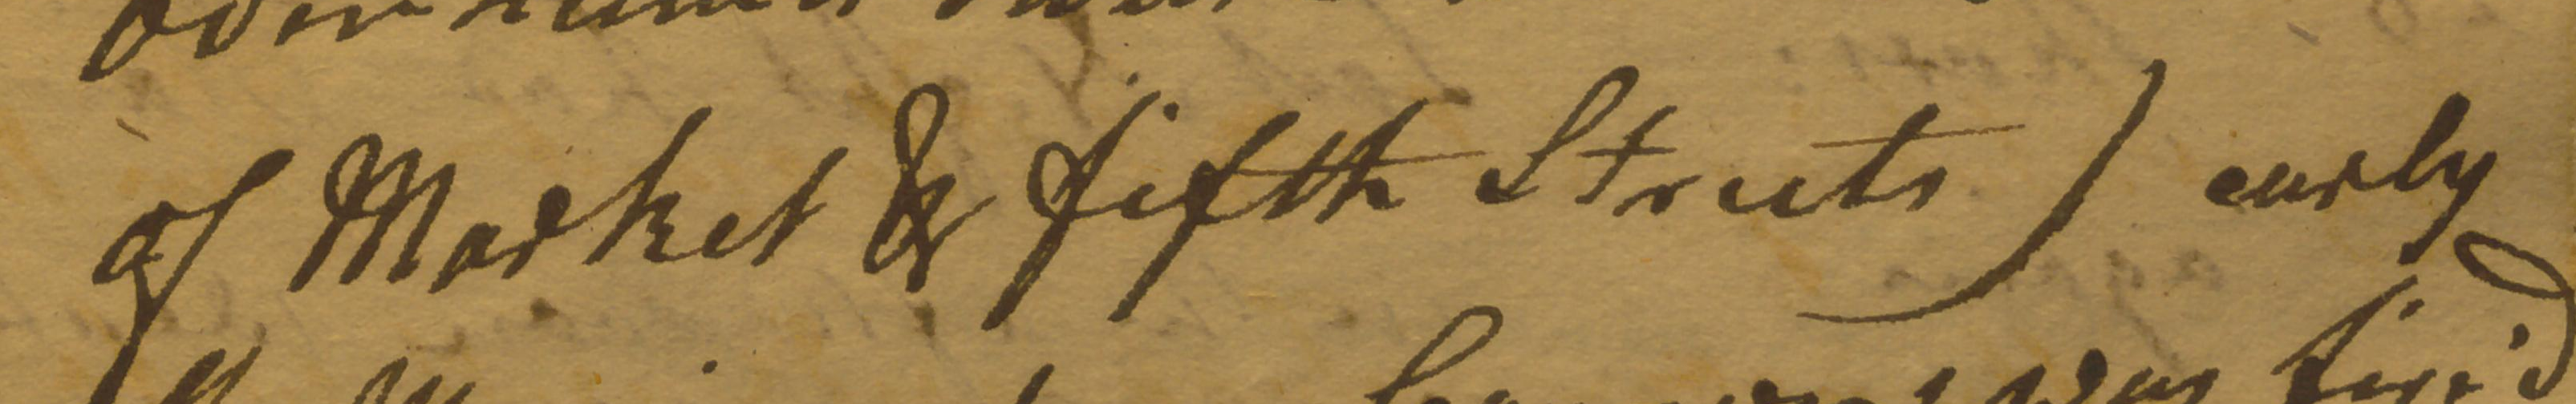of Market & fifth Streets) early
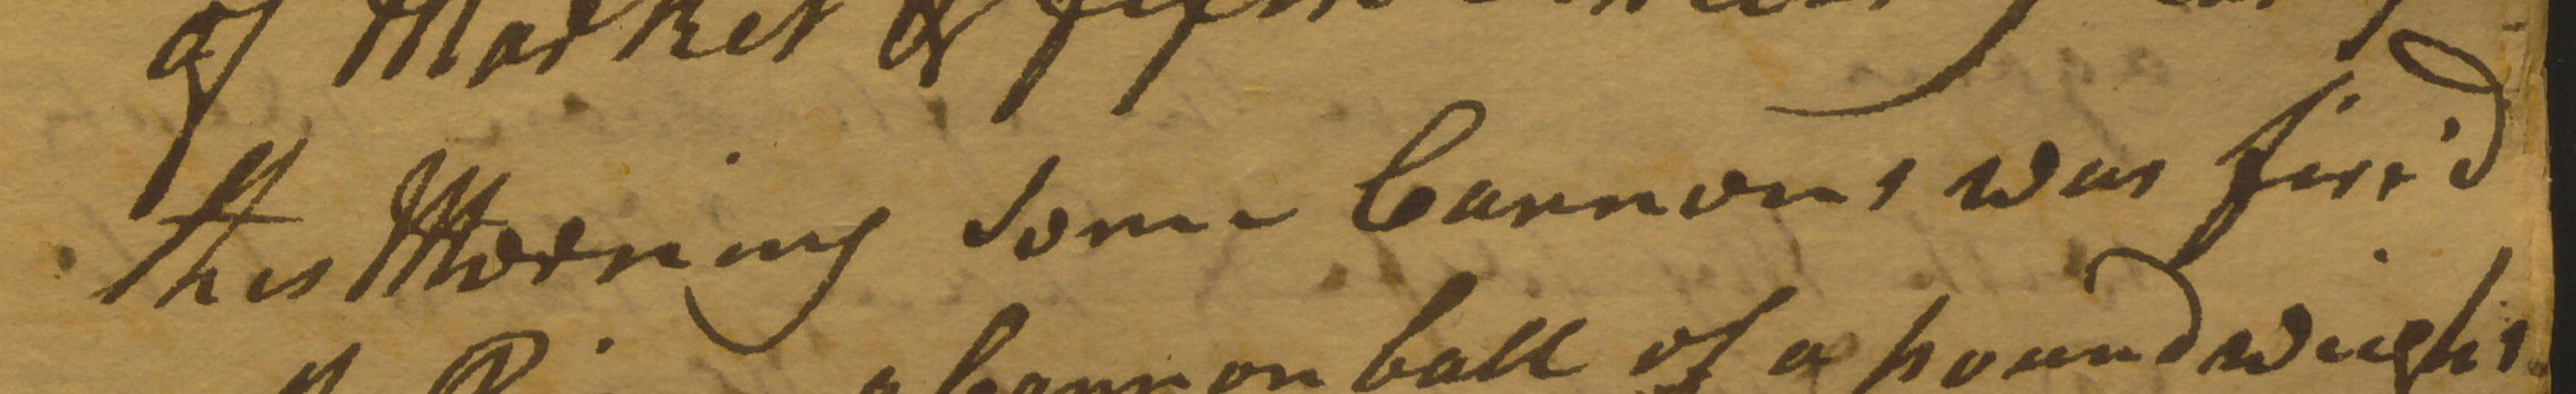this morning some Cannons was fire'd
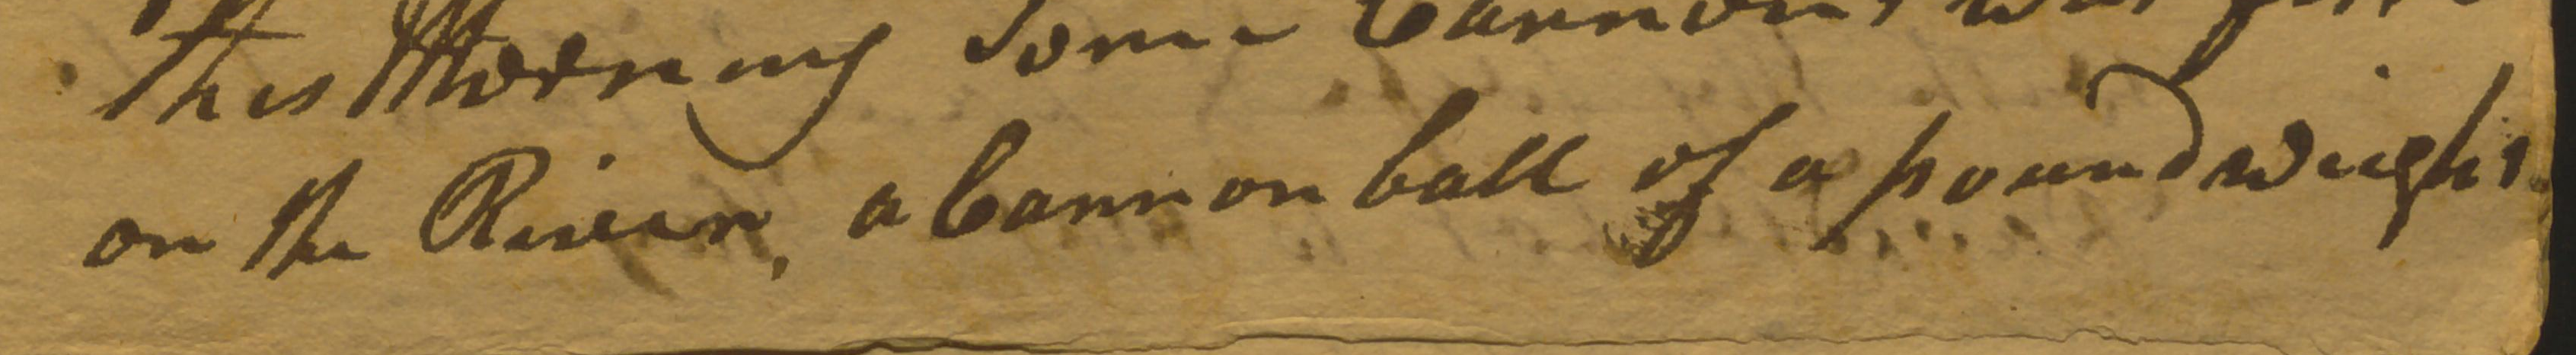on the River, a Cannonball of a pound weight
